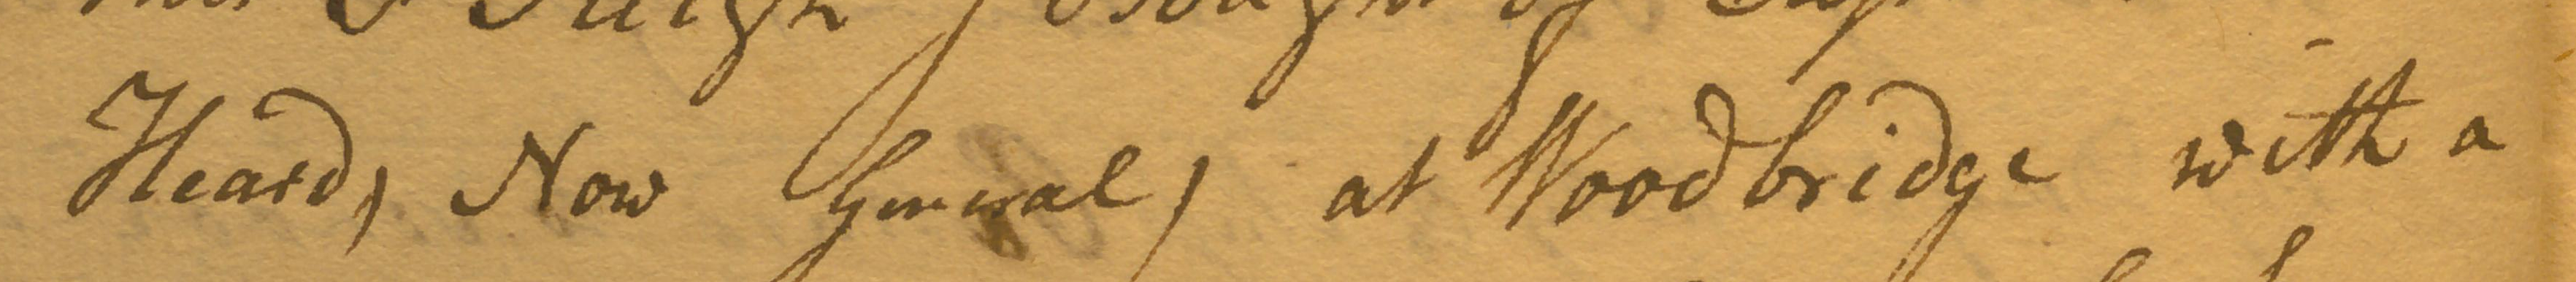Heard, Now General) at Woodbridge with a
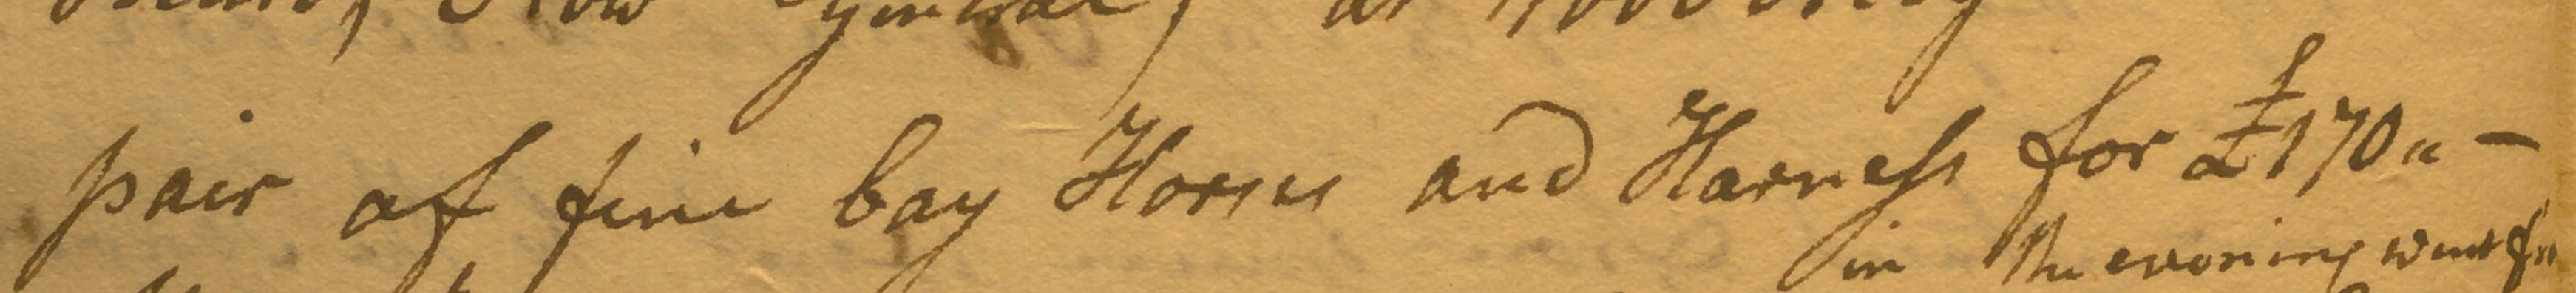pair of fine bay Horses and Harness for £170.-
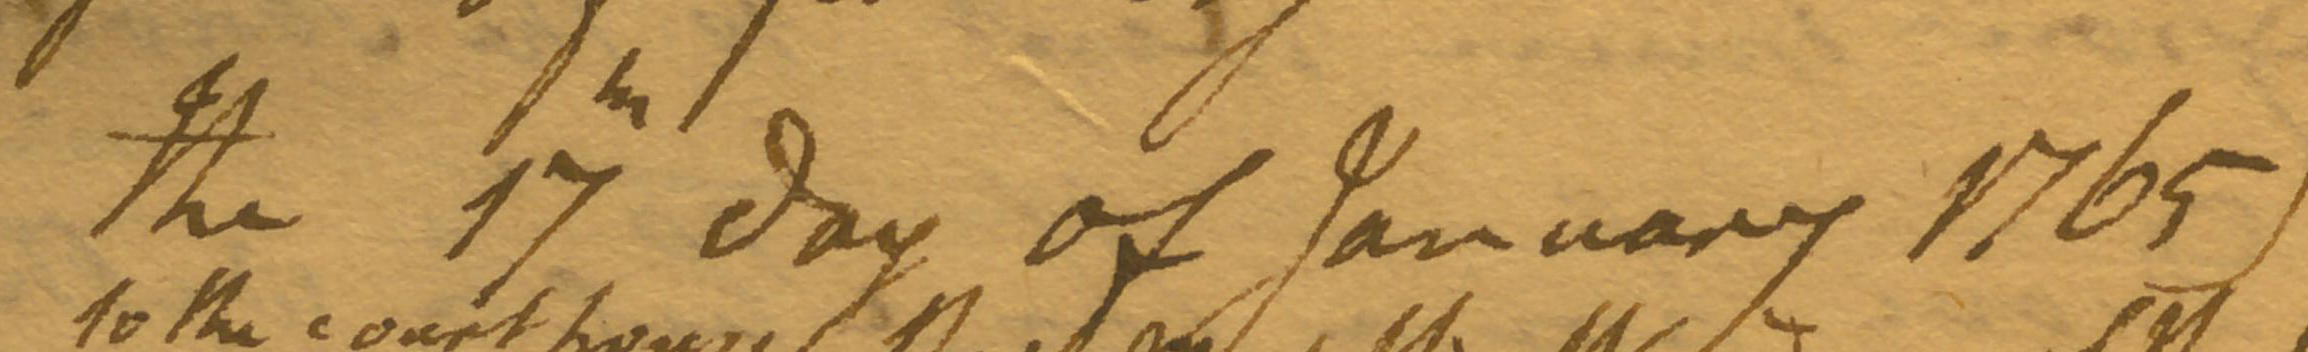the 17^th day of January 1765
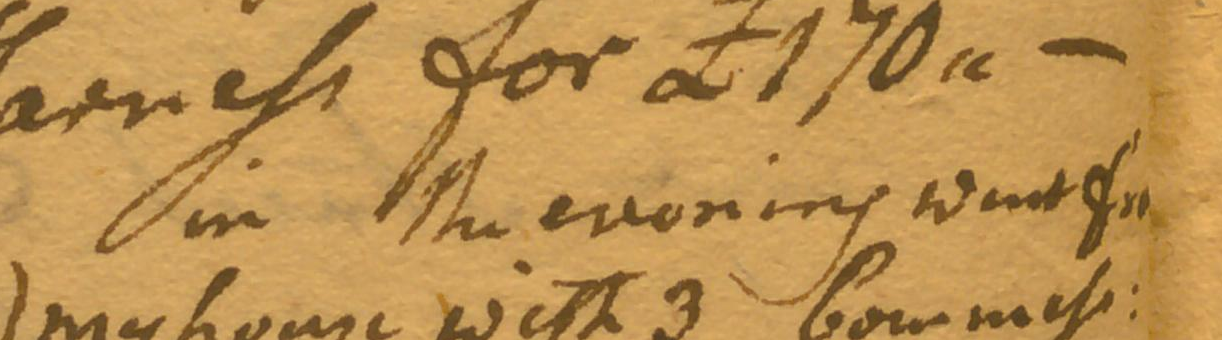Sin the evening went for
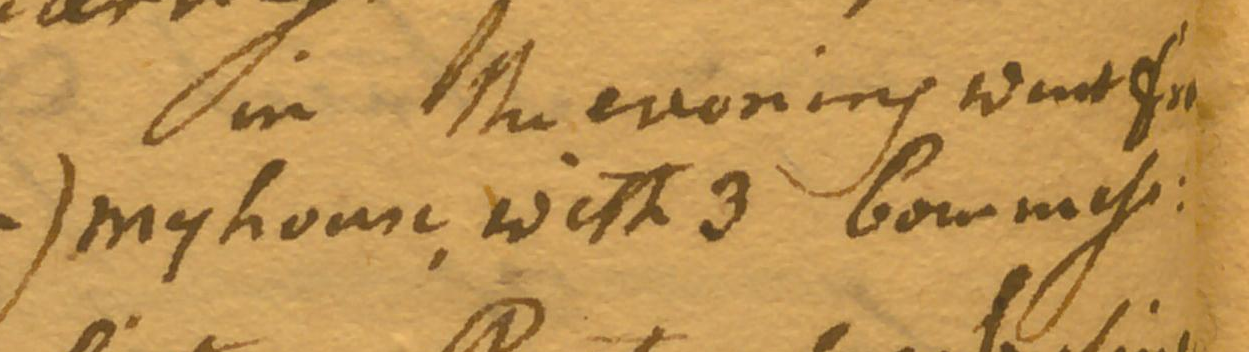my house with 3 Commiss:
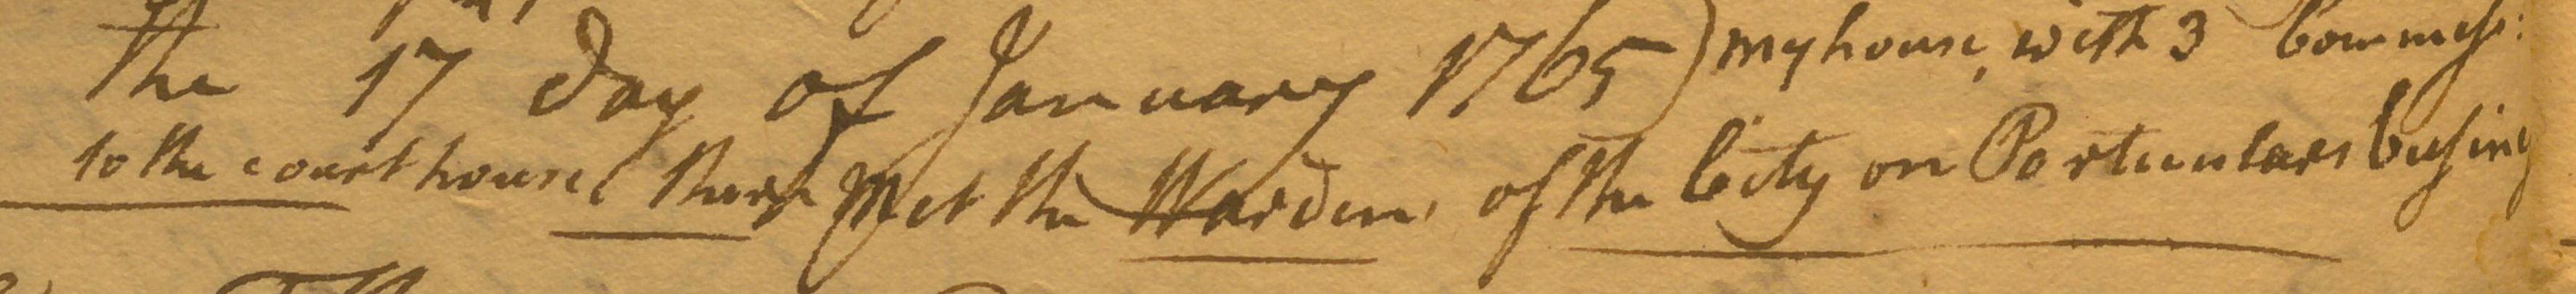to the courthouse there Met the Wardens of the City on Particulars business
